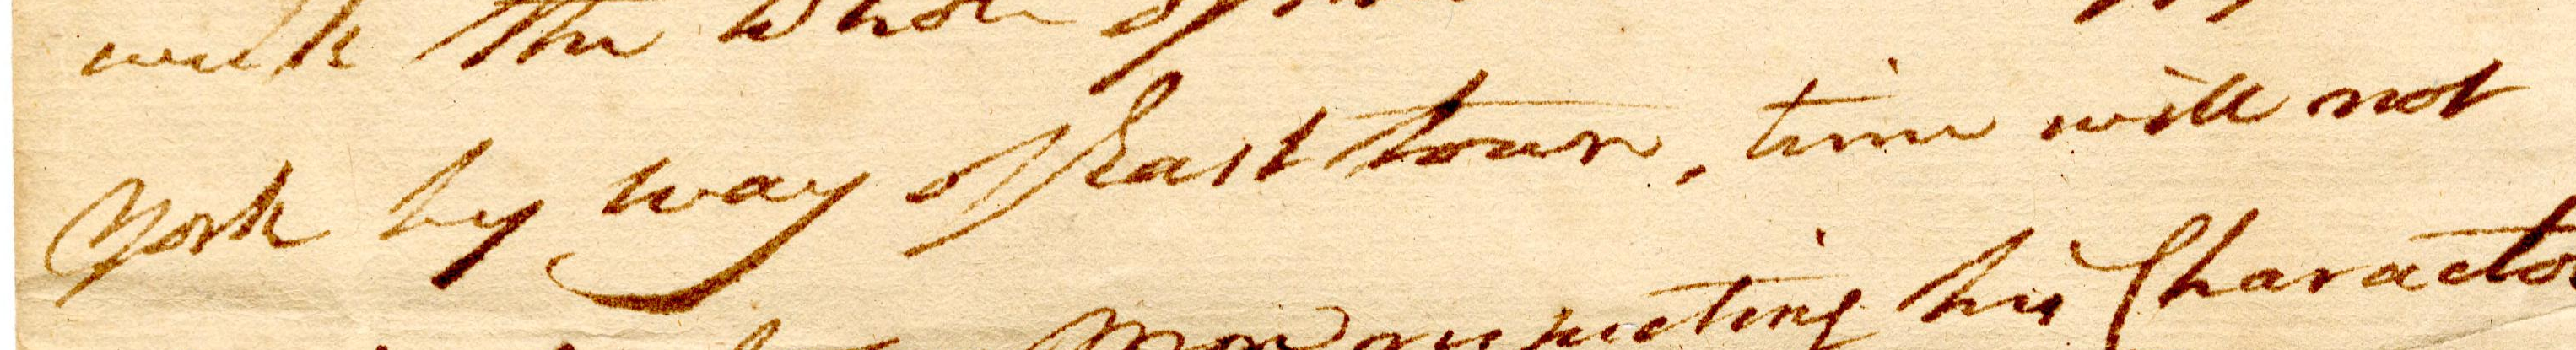York by way of Easttown, time will not
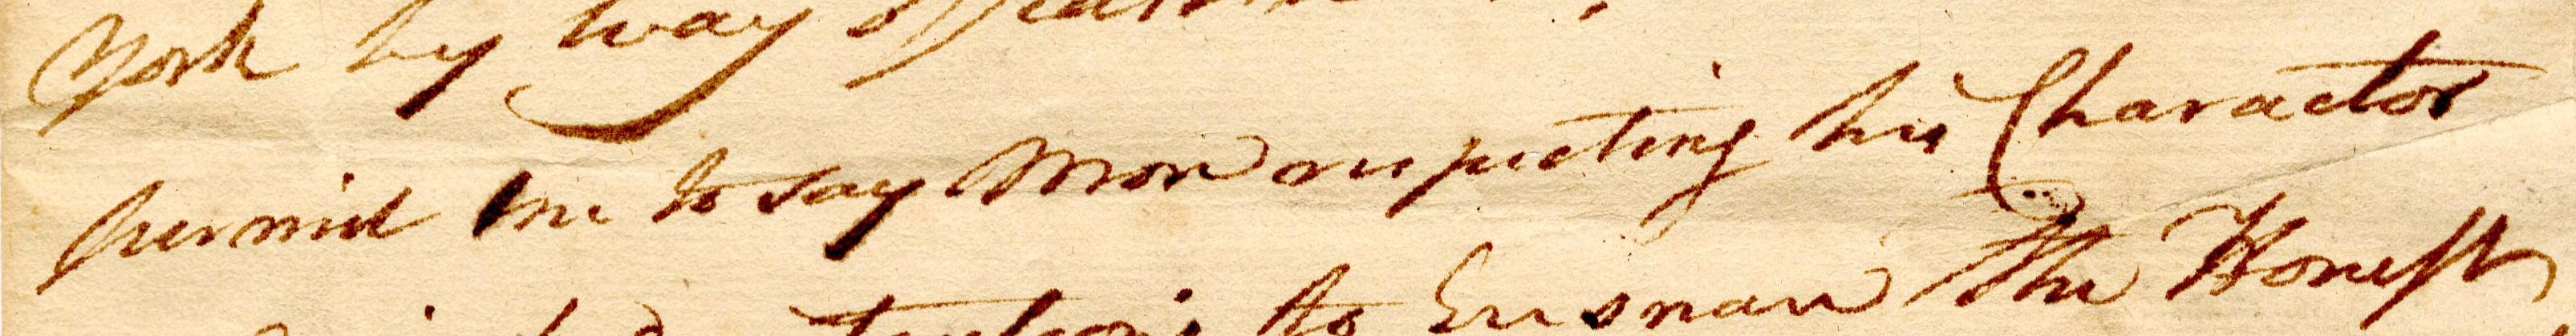permit me to say more respecting his Character
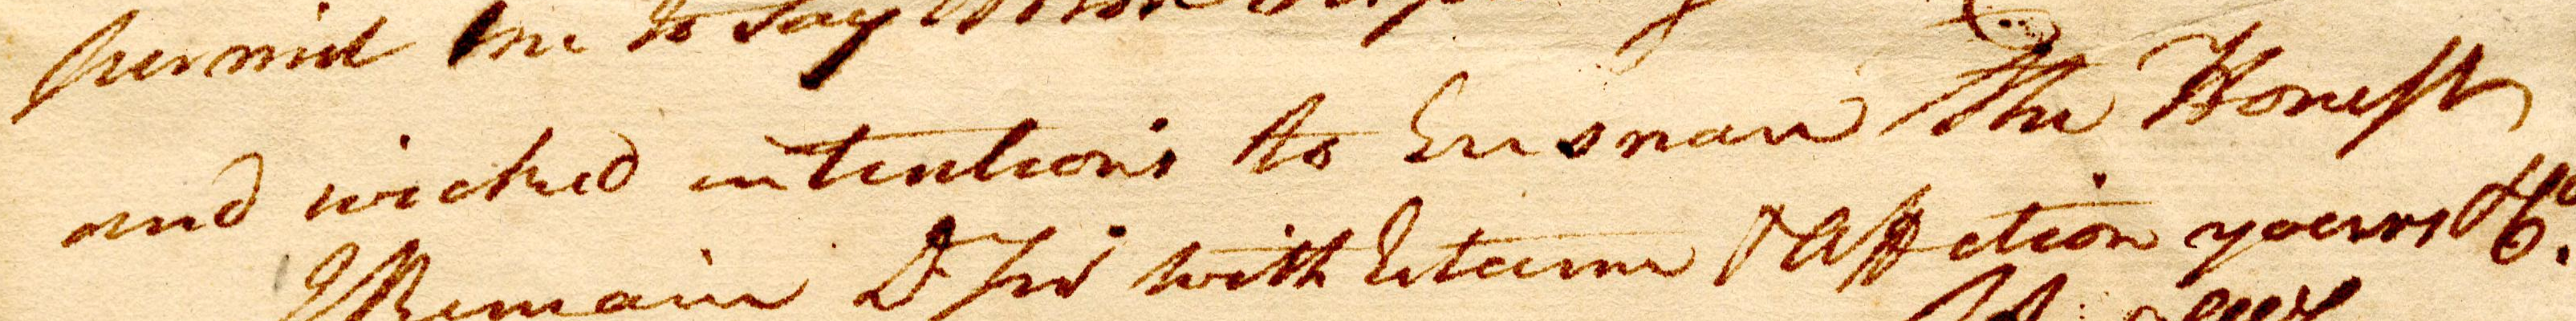and wicked intentions to Ensnare the Honest
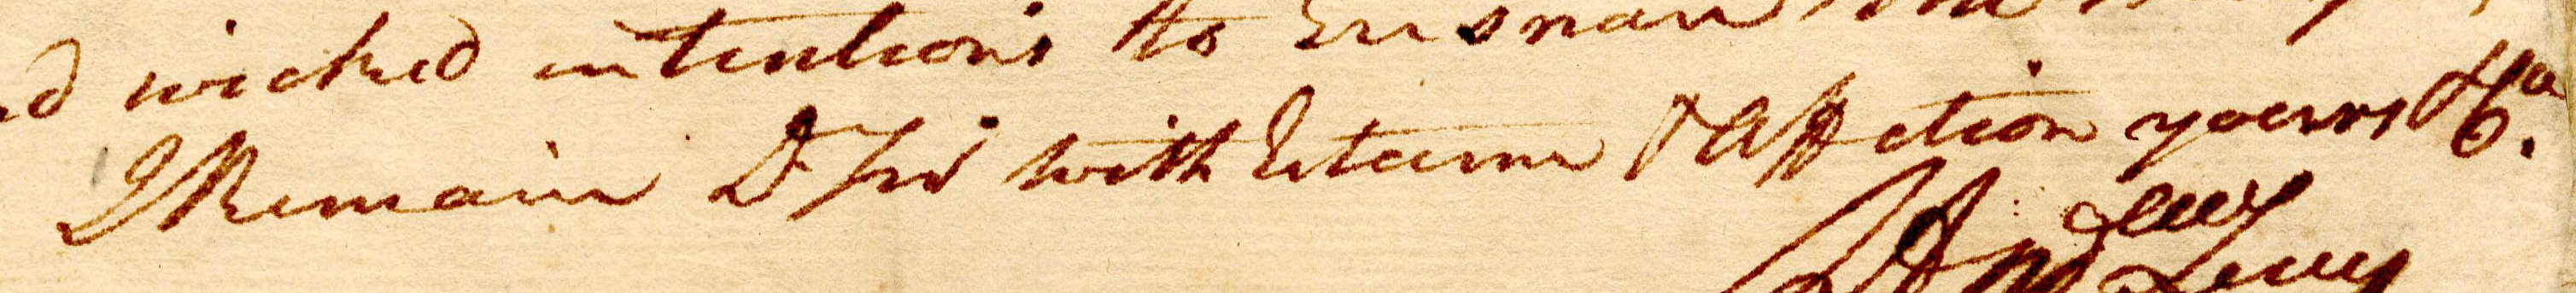I Remainr D^r sir with esteem & Affection your H^le.
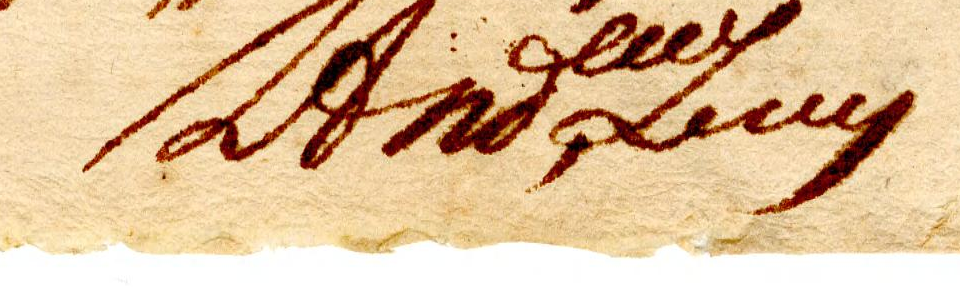And^rew Levy
